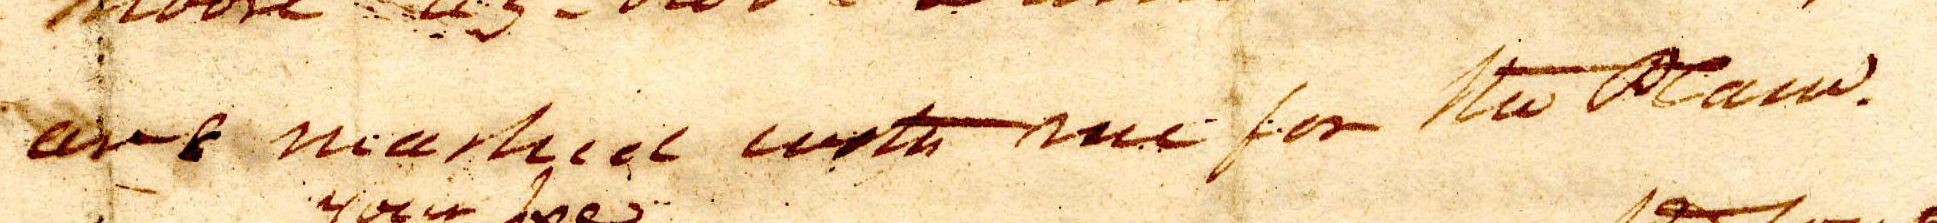are market with sue for the Plan.
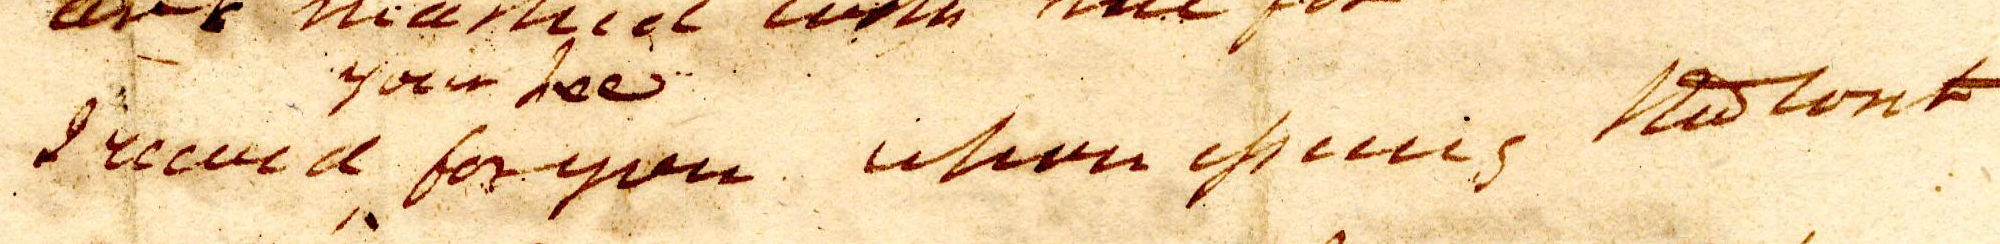I recved for you when issueing New [_]ont
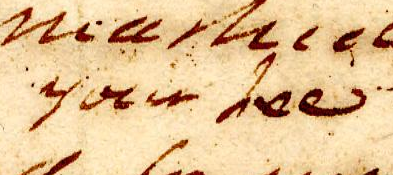your fee
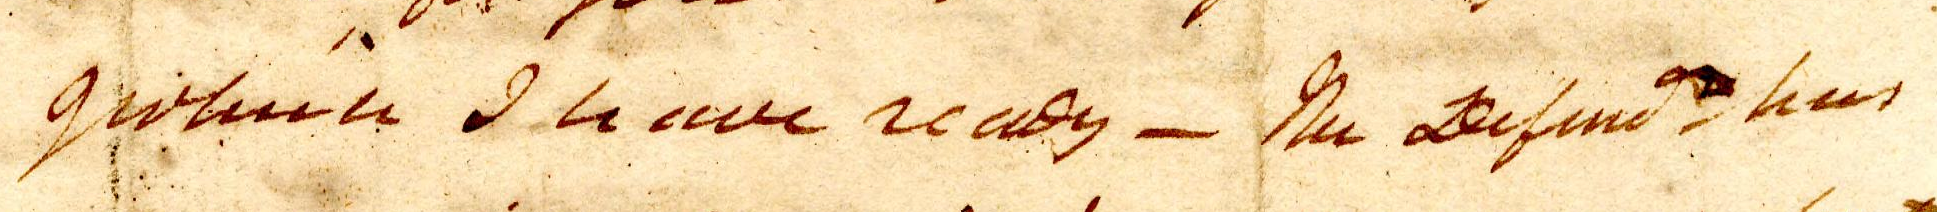& which I have ready- The Defend^t. has
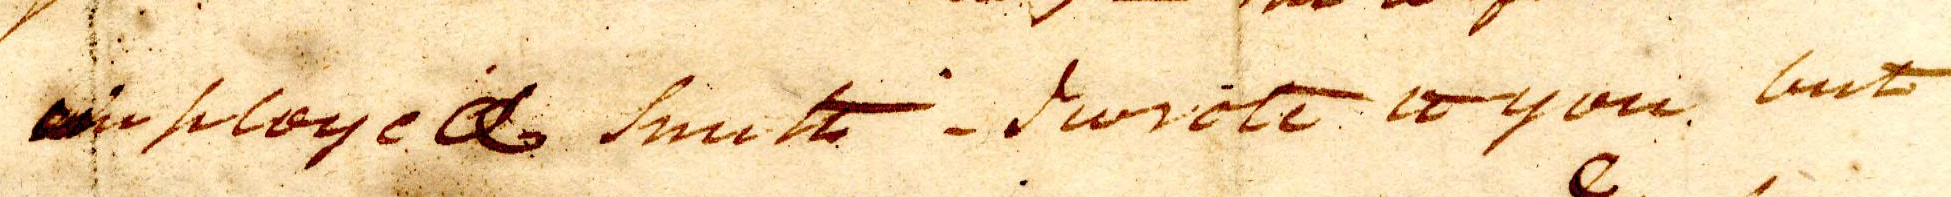employed Smith. I wrote to you but
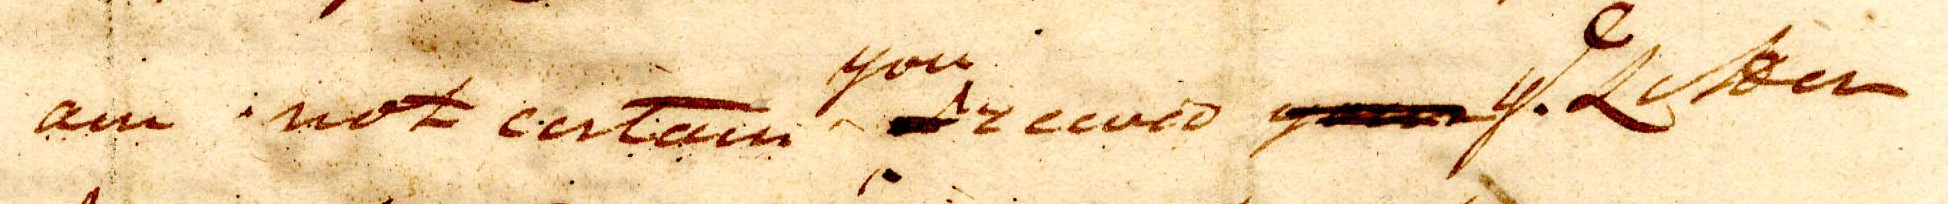am not certain ^ recved your y^e. Letter
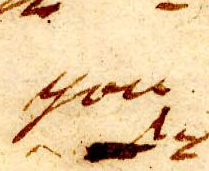you
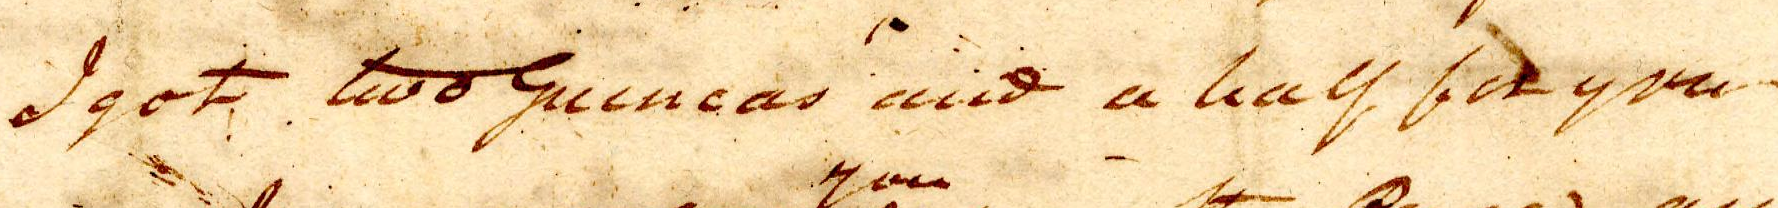I got two Guineas and a half for you
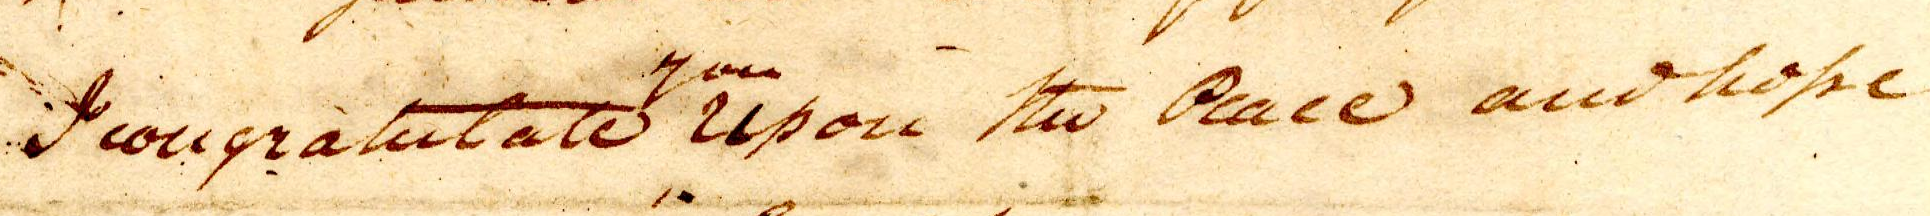I congratulate ^ upon the Peace and hope
